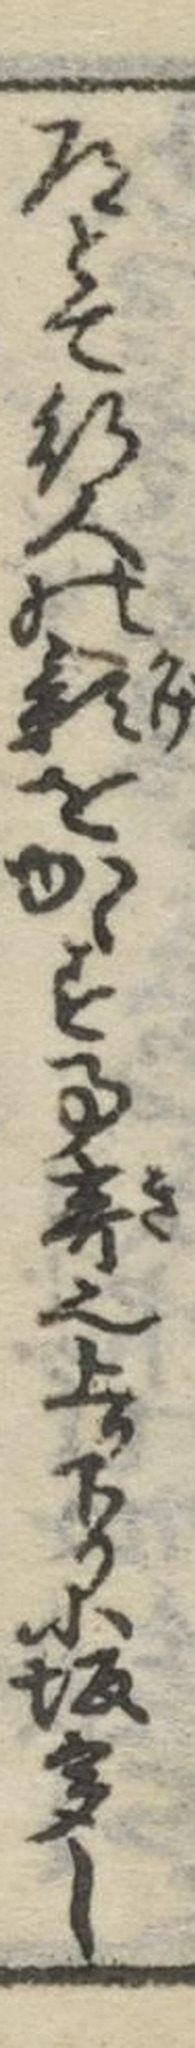道とて行人の影をかゝす事奇也上り下り小坂多し
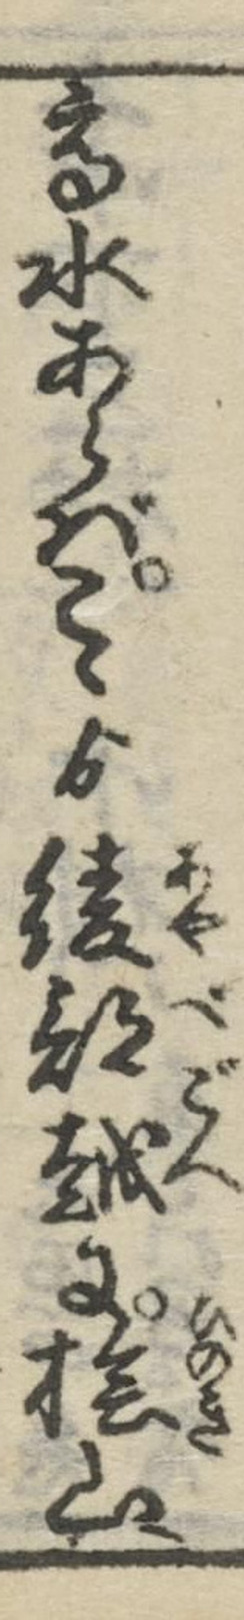高水あらば。こゝゟ綾部越に。桧山
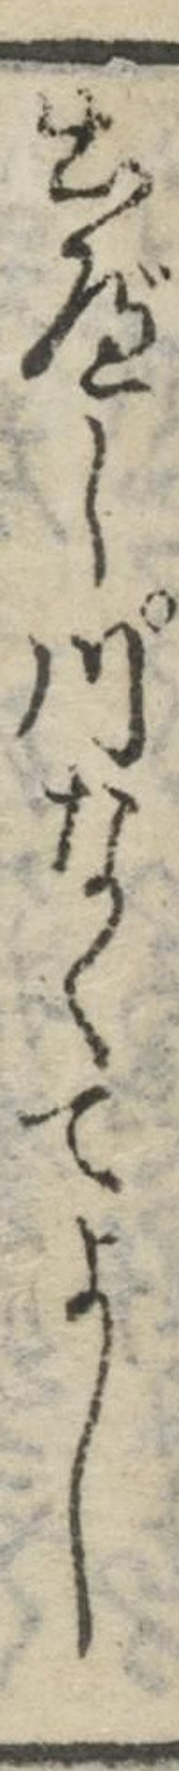出べし。川なくてよし
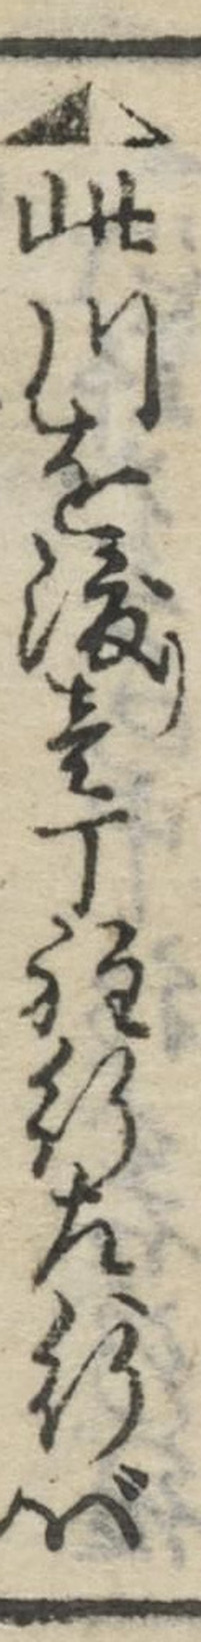▲此川を渡り壱丁程行左へ行ば
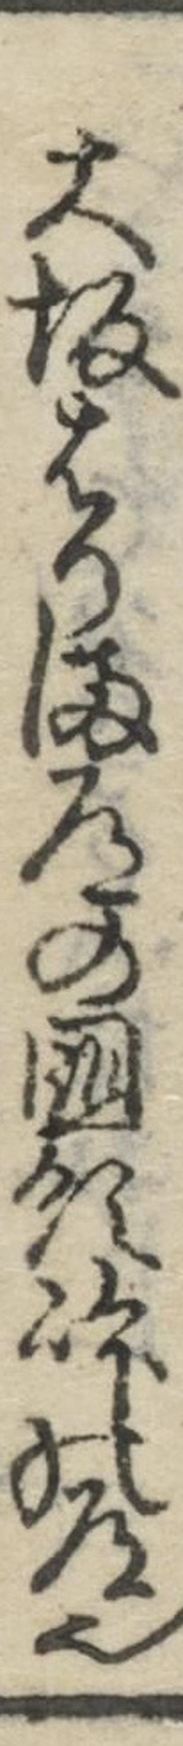大坂はりま道の国領跡の道也
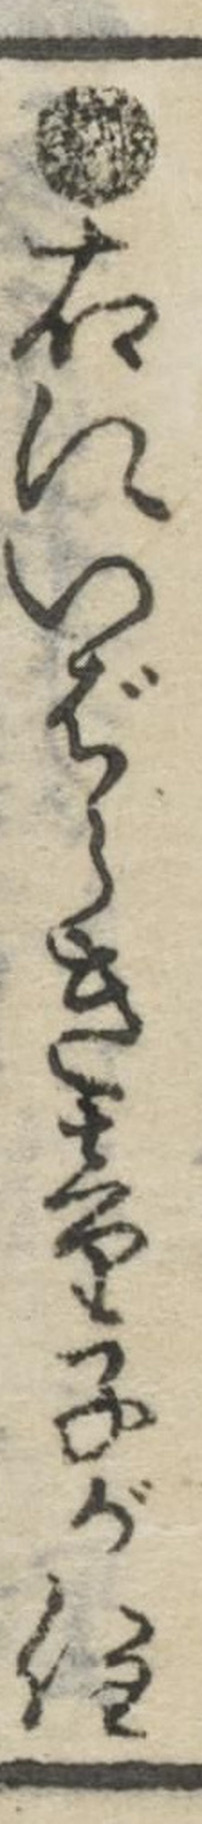●右にいばらき童子が住
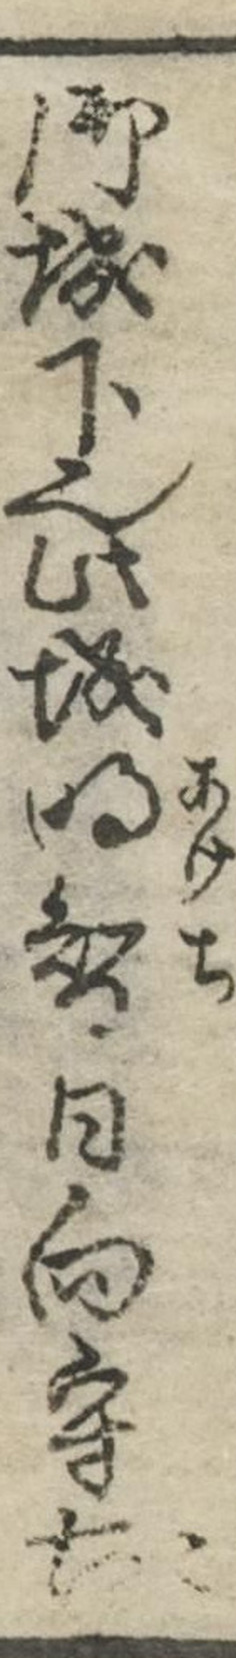御城下也此城明智日向守古
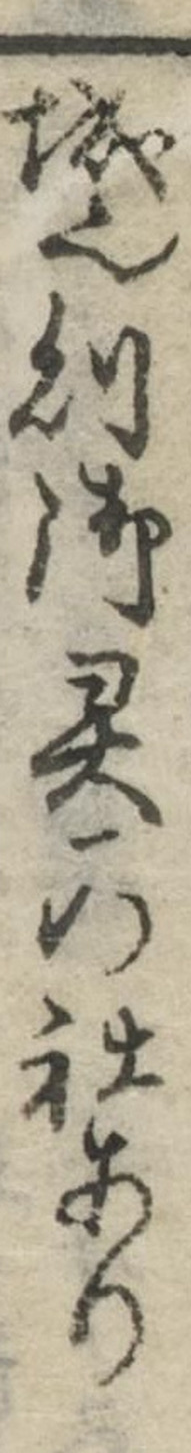城也則御霊一の社あり
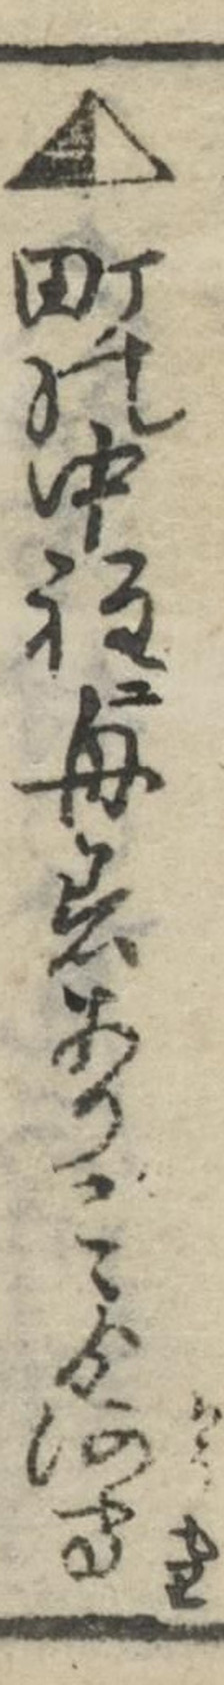▲町の中程に舟着ありこゝゟ河守

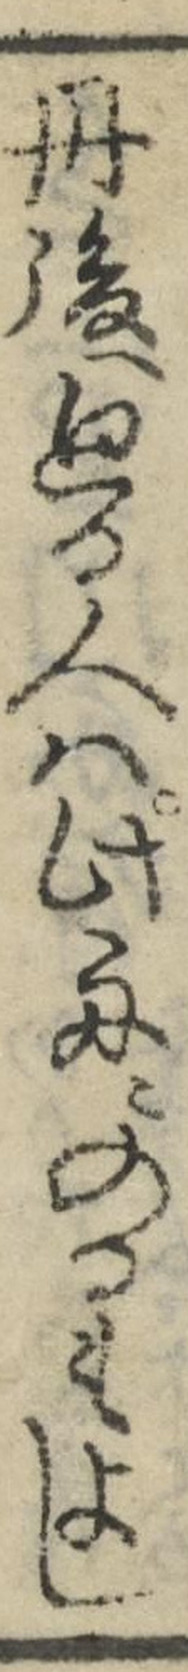丹後へ廻る人は。此舟にのるもよし
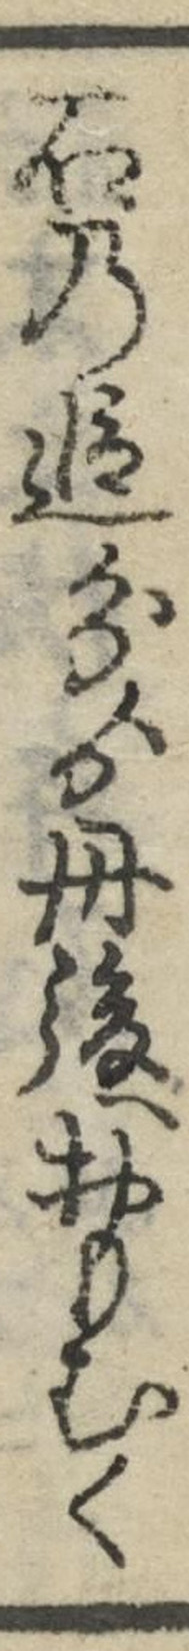石の追分ゟ丹後へおもむく
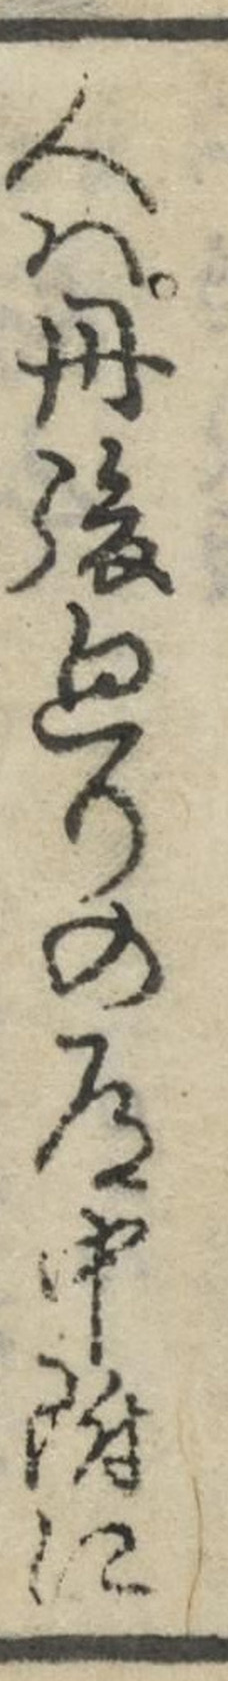人は。丹後廻りの道中附に
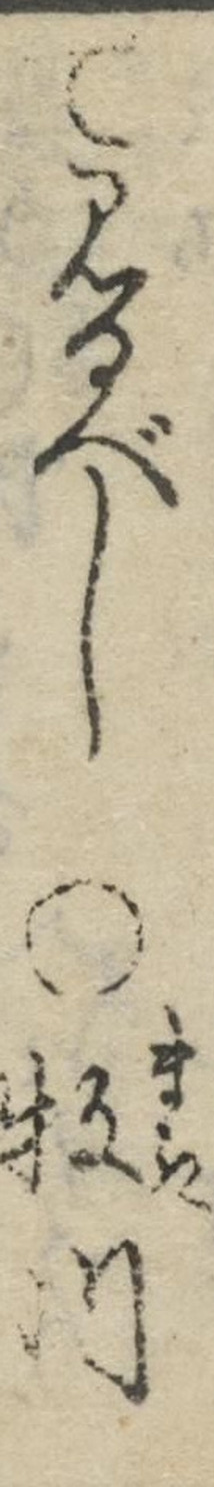て見るべし○牧川
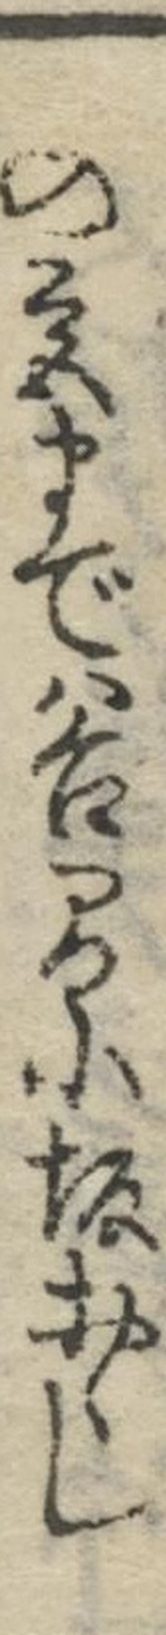の宮まで谷間小坂おゝし
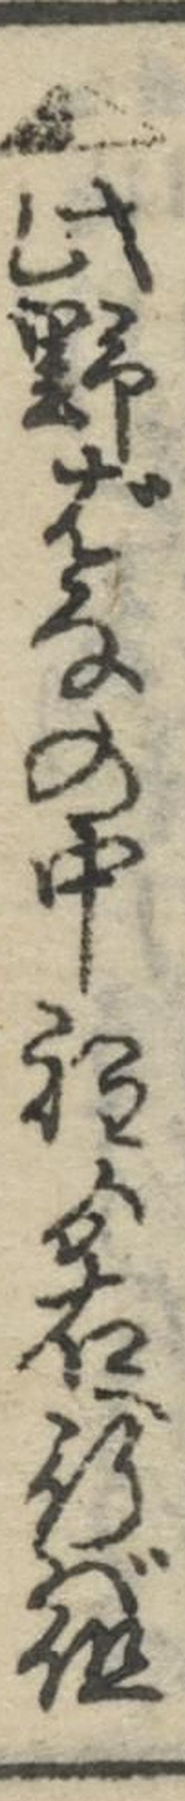▲此野ばなの中程ゟ右へ行ば但
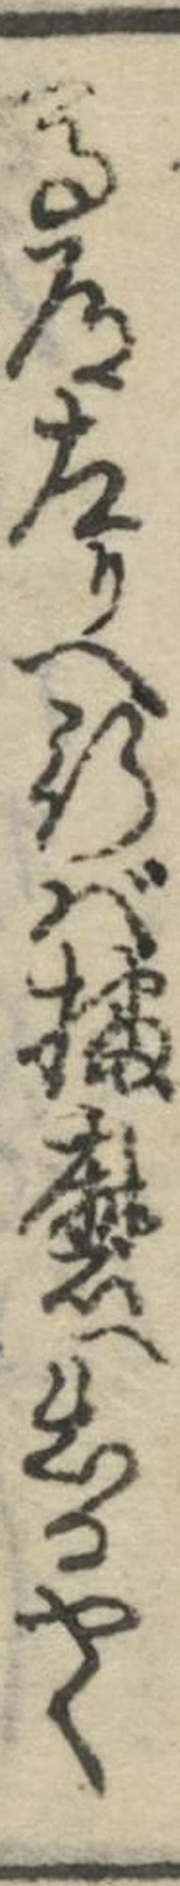馬道左りへ行ば播磨へ出るやく
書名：但州城崎浴湯辧
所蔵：東京大学地震研究所図書室 Earthquake Research Institute Library, The University of Tokyo, JAPAN
